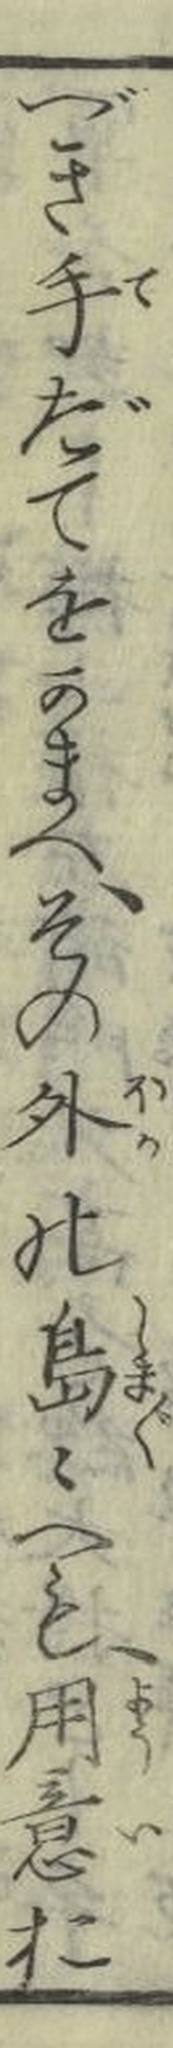べき手だてをかまへ、その外の島々へも、用意お
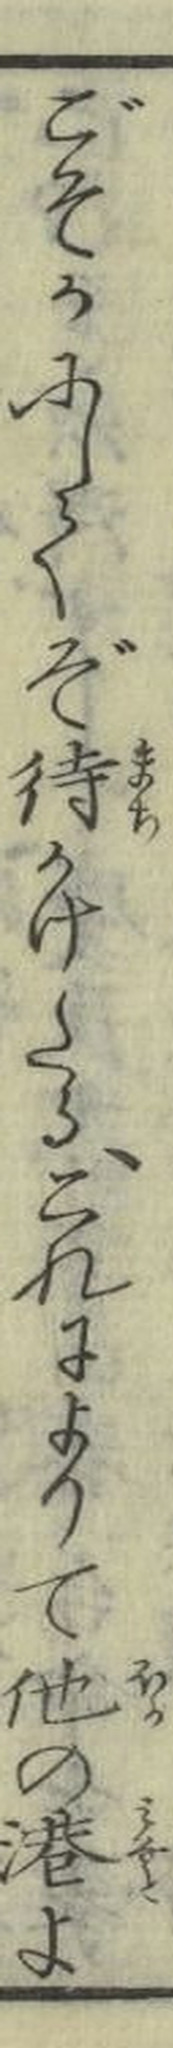ごそかにしてぞ待かけたる、これによりて他の港よ
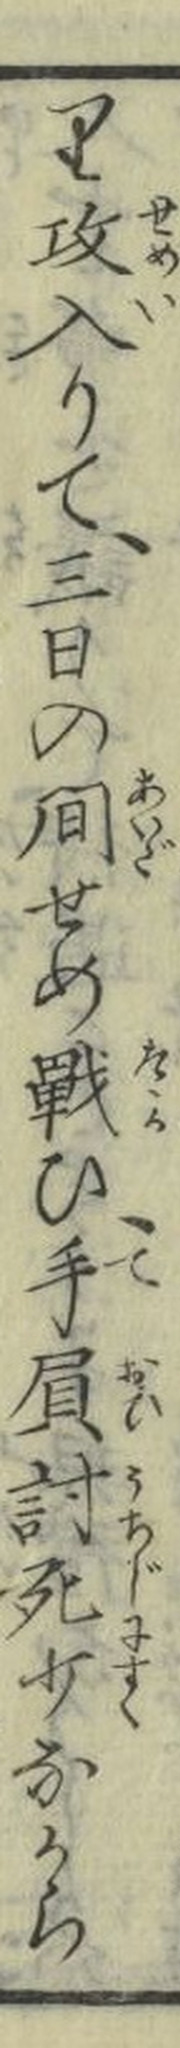り攻入りて、三日の間せめ戦ひ、手負討死少なから
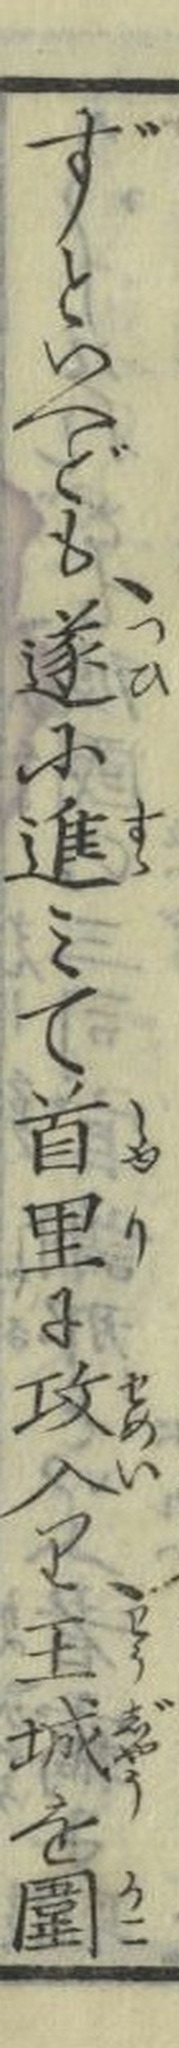ずといへども、遂に進みて首里に攻入り、王城を囲
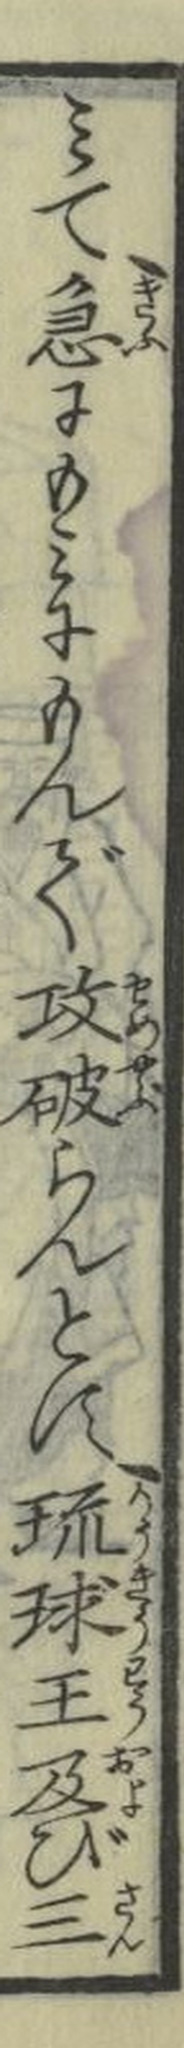みて、急にもみにもんで攻破らんとす、琉球王及び三
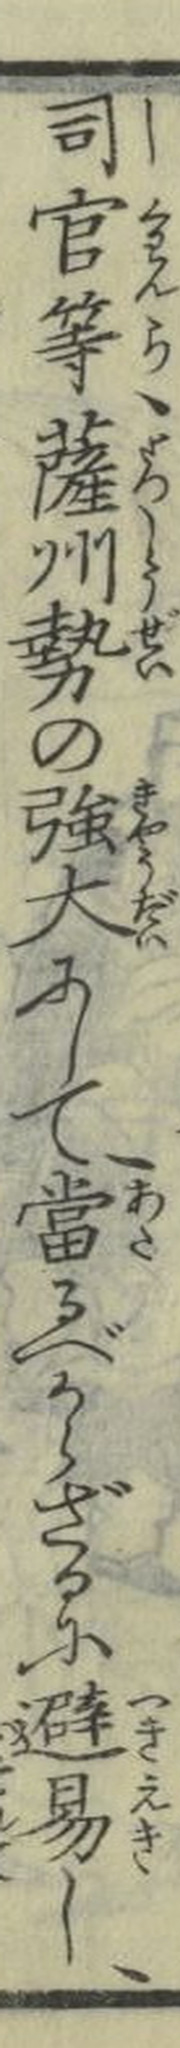司官等、薩州勢の強大にして、当るべからざるに避易し、
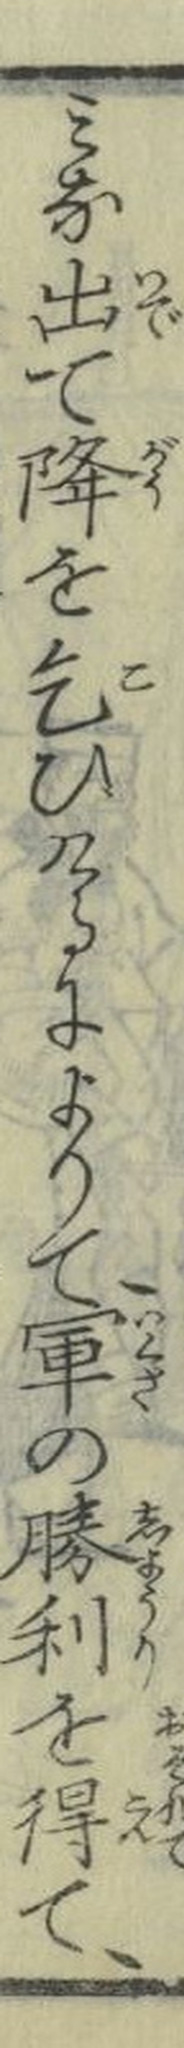みな出て降を乞ひけるによりて、軍の勝利を得て、
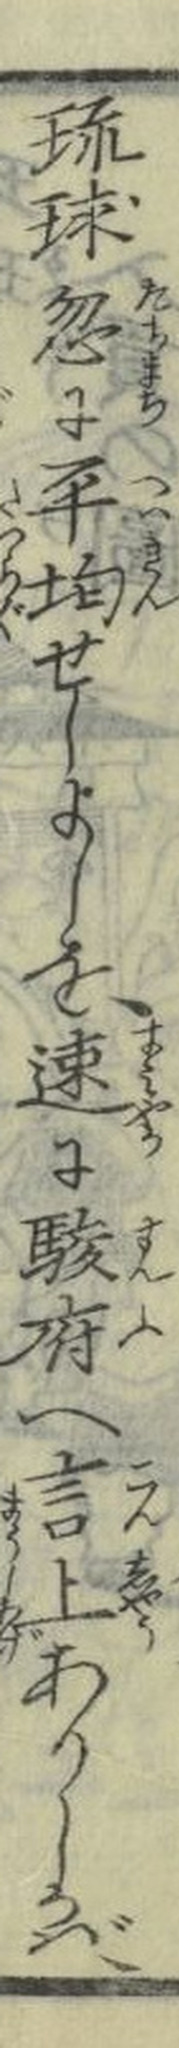琉球忽に平均せしよしを、速に駿府へ言上ありしかば、
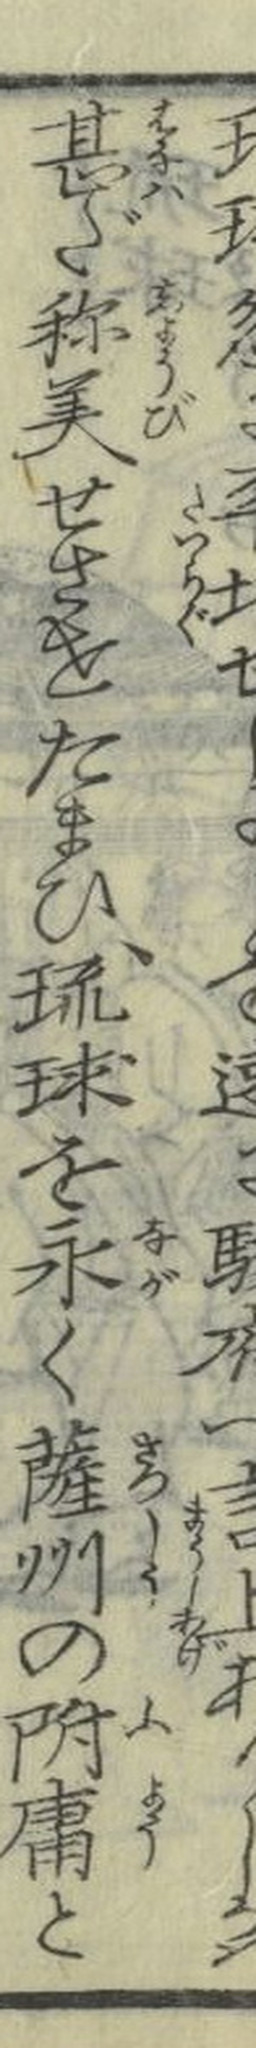甚だ称美せさせたまひ、琉球を永く薩州の附庸と
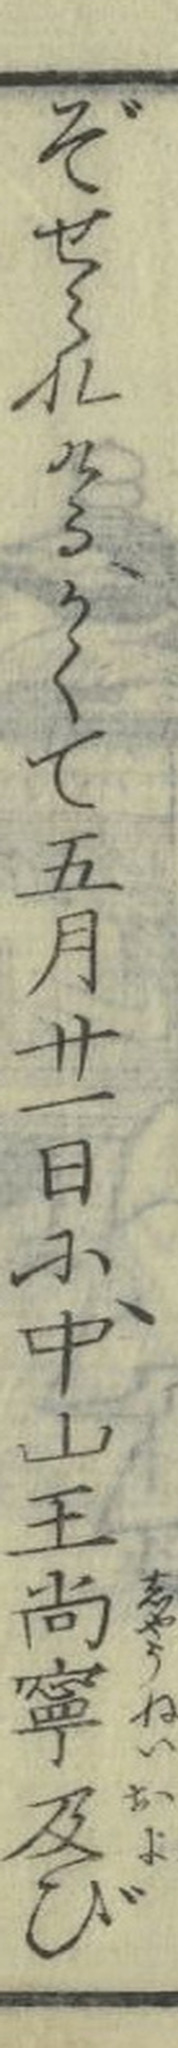ぞせられける、かくて五月廿一日に、中山王尚寧及び
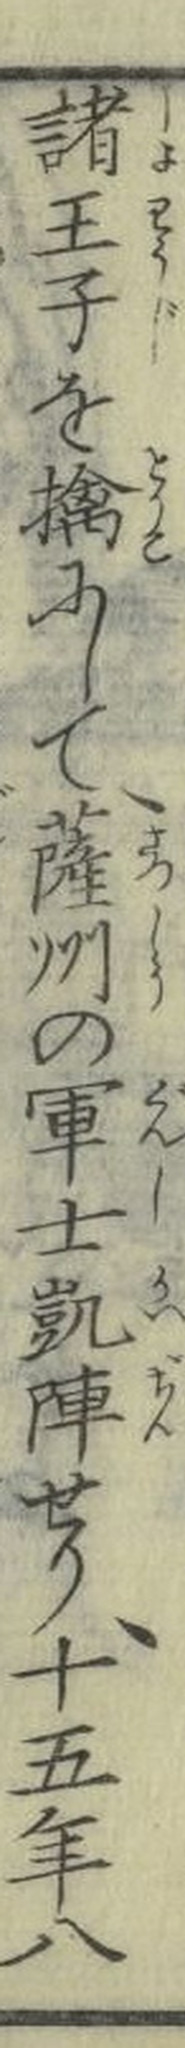諸王子を擒にして、薩州の軍士凱陣せり、十五年八
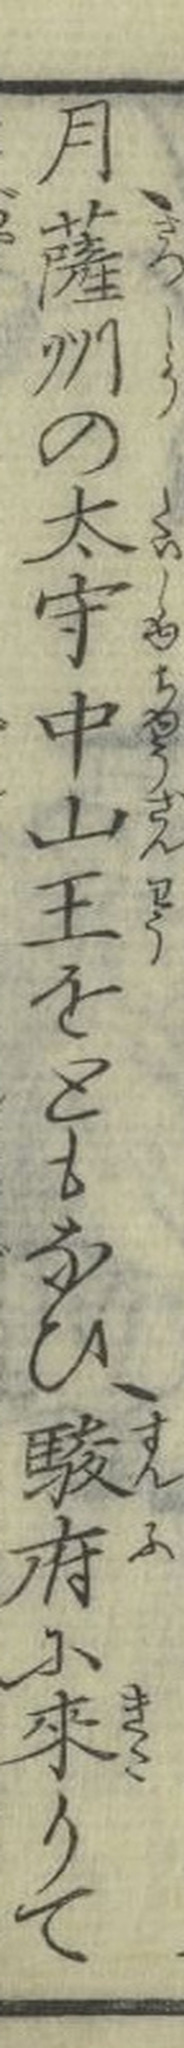月、薩州の太守中山王をともなひ、駿府に来りて
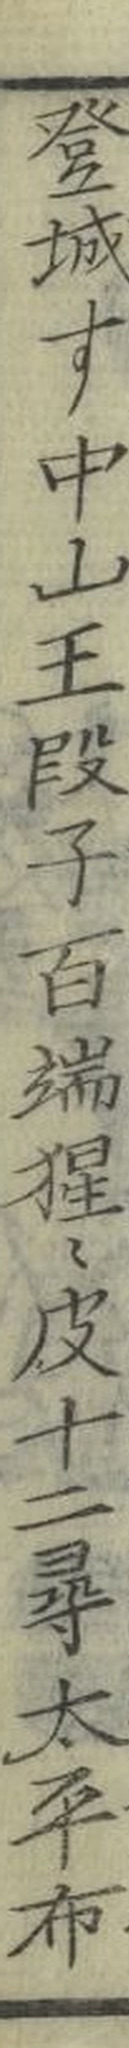登城す、中山王段子百端、猩々皮十二尋、太平布

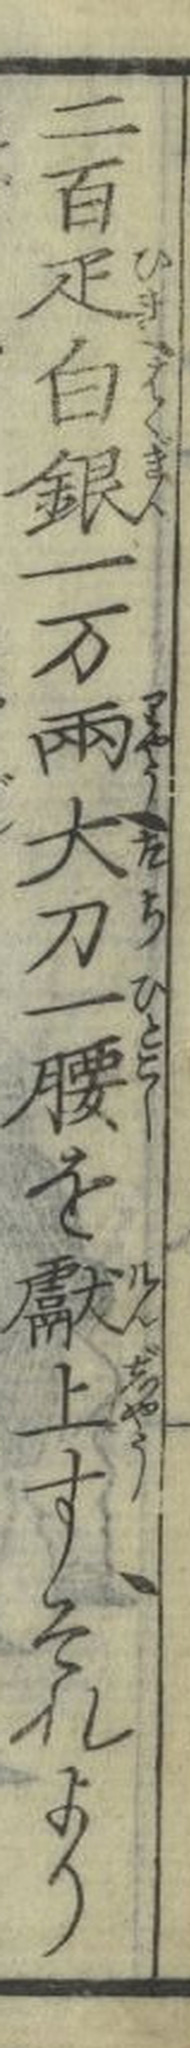二百疋、白銀一万両、大刀一腰を献上す、それより
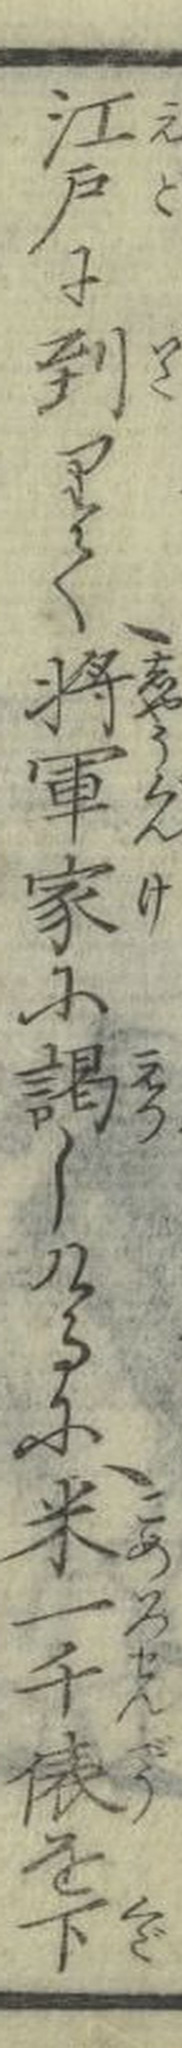江戸に到りて、将軍家に謁しけるに、米一千俵を下
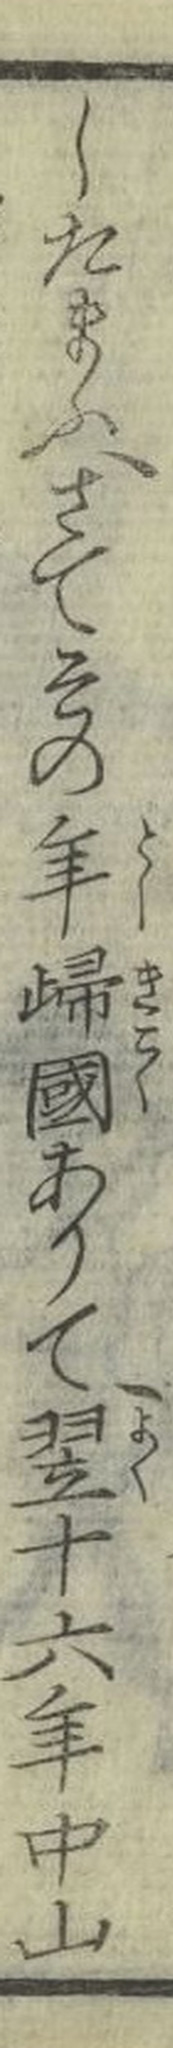したまふ、さてその年帰国ありて、翌十六年中山
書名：琉球入貢紀畧
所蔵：University of the Ryukyus Library
